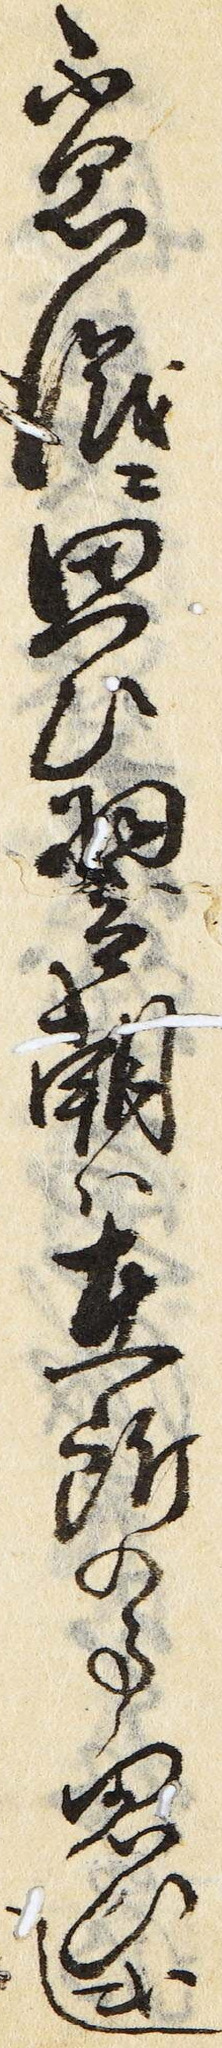不思儀ニ思ひ翌朝ハ在所の事思ひ出し
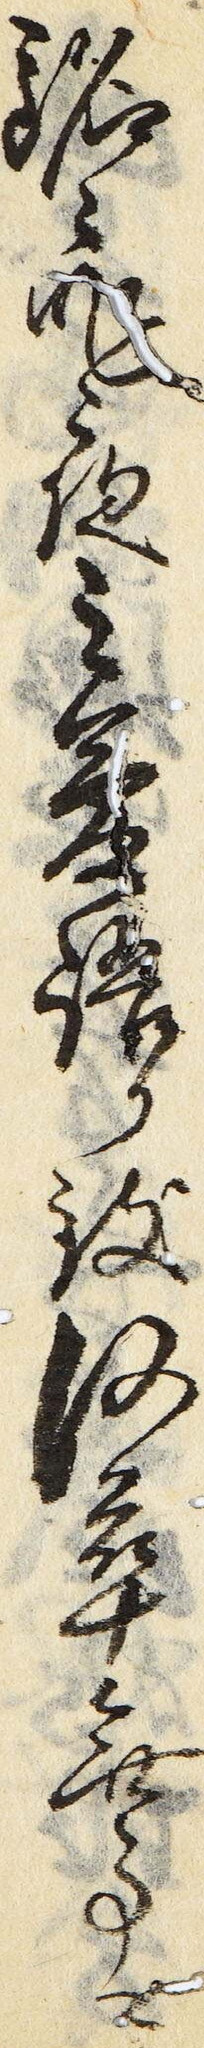銘々昨夜之夢語り致何卒無事ニ
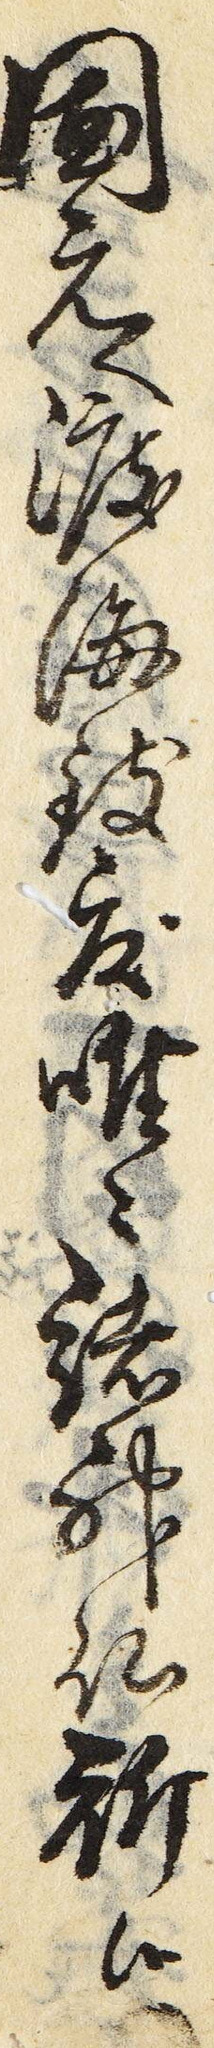国元へ渡海致度唯々諸神仏祈候
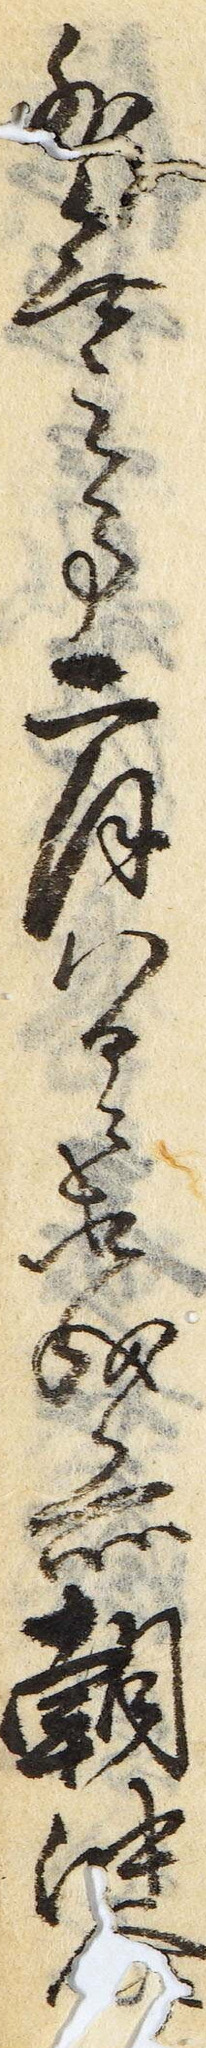外無之事二月八日ニ相成候所朝沖合

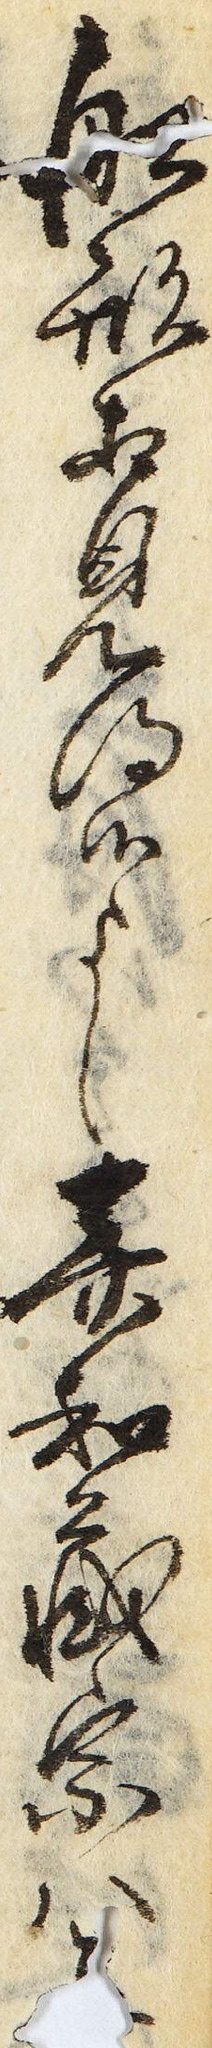船形相見得候よし喜和蔵宗八
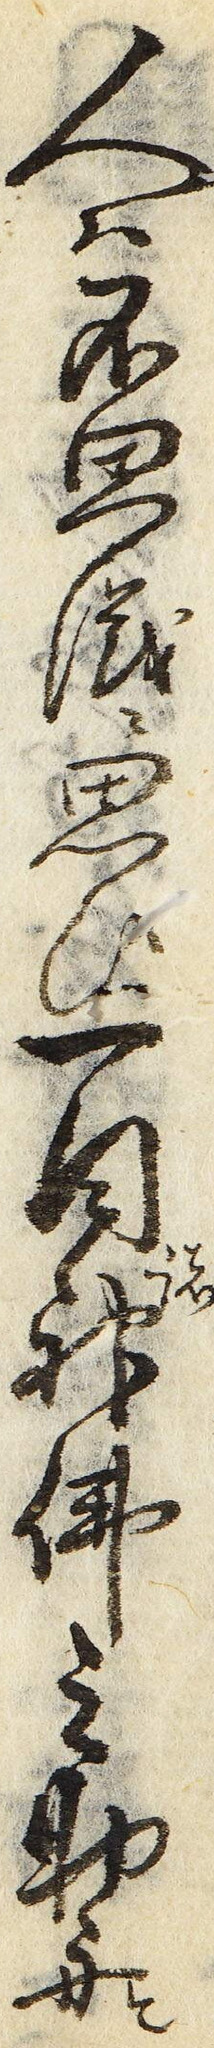人ハ不思儀ニ思ひ一同諸神仏之助舟と
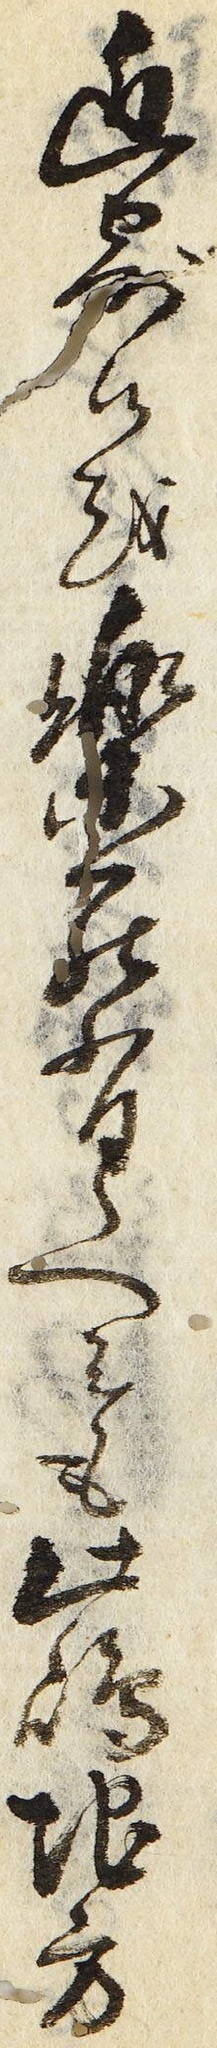近寄候を楽罷有候へとも此嶋地方
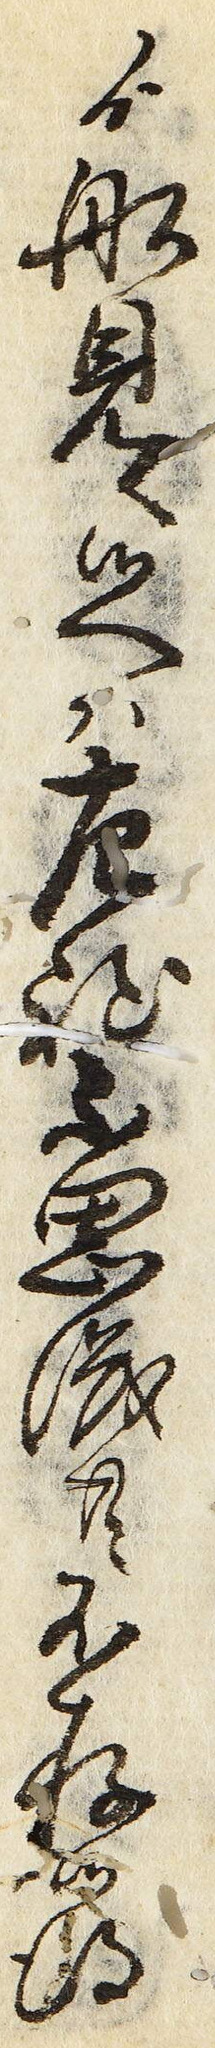ゟ船見へ候ヘハ左程不思儀共不存候得
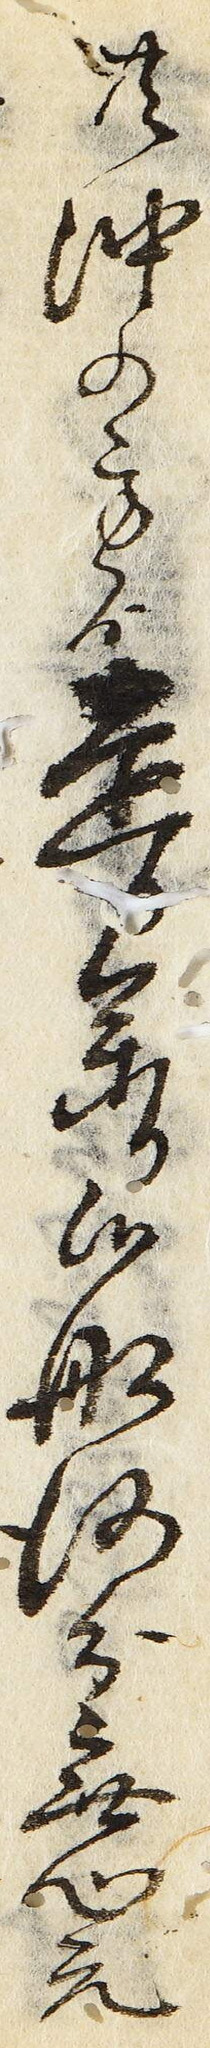共沖の方ゟ走り参り候船何分無心元
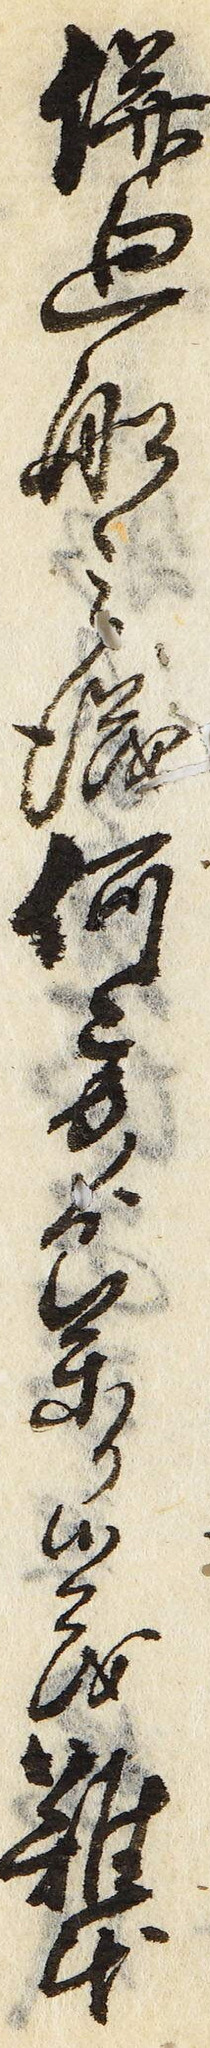併廻船之儀何方ゟ参り候も難計
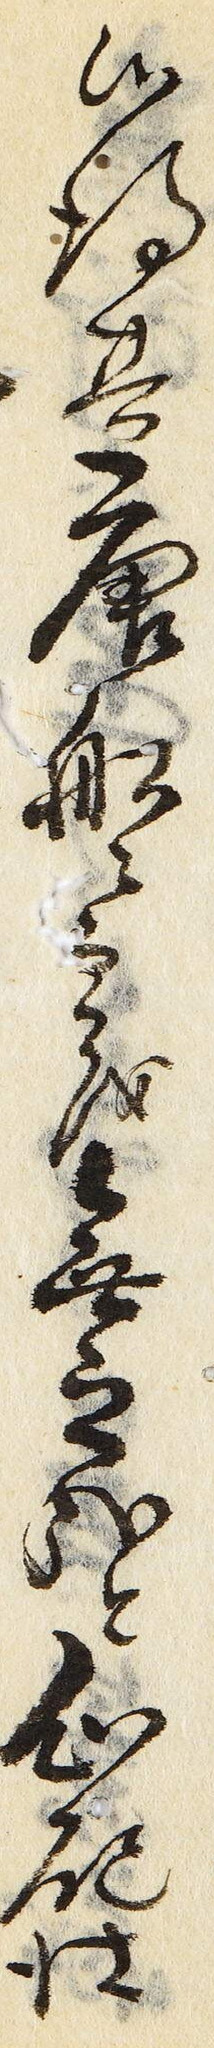候得共唐船ニ而も無之哉と心配仕
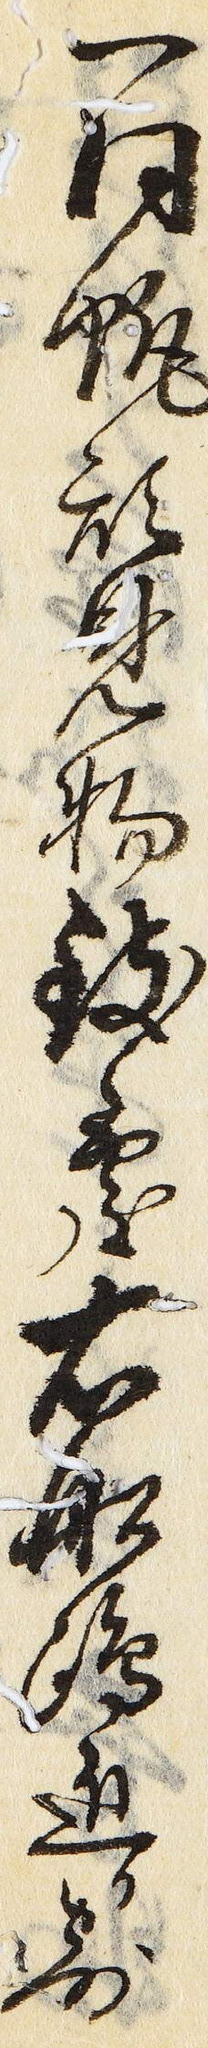一同帆形見物致候処右船嶋近ク寄
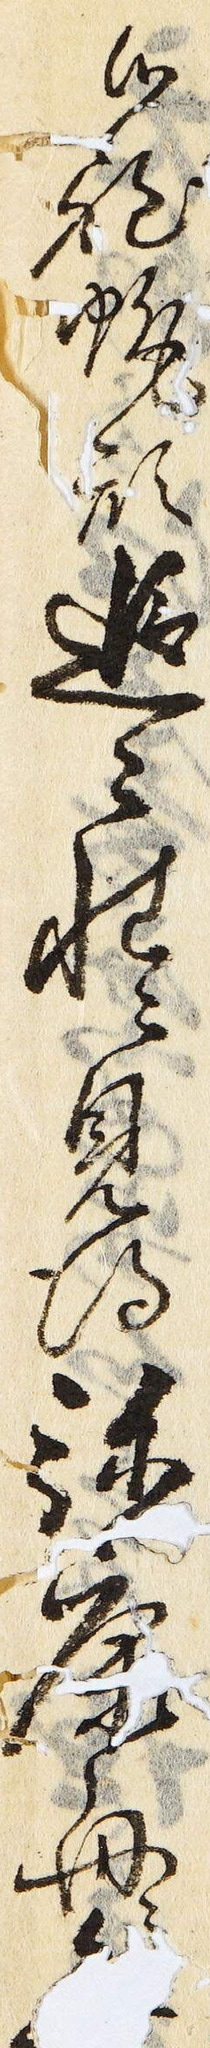候程帆形追々慥ニ見得弥唐舟ニ
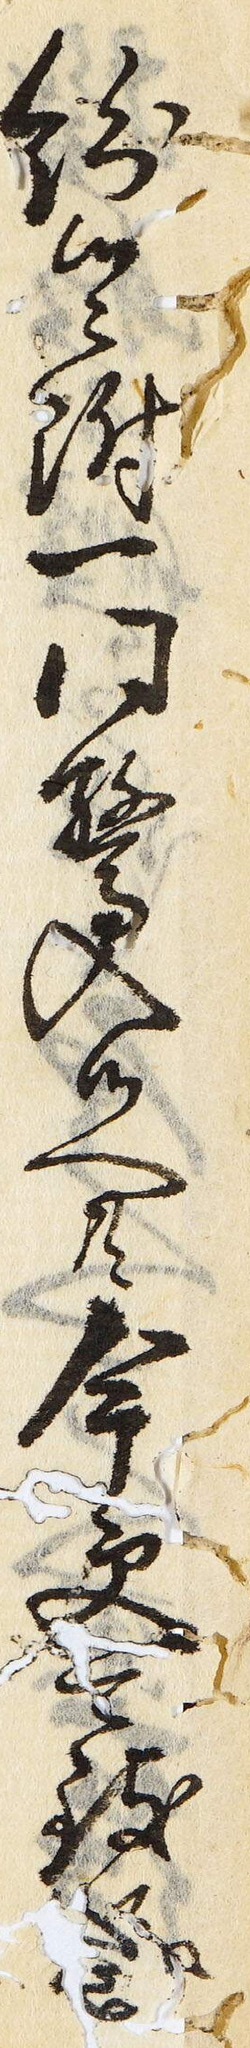紛候ニ付一同驚入候へ共今更可致
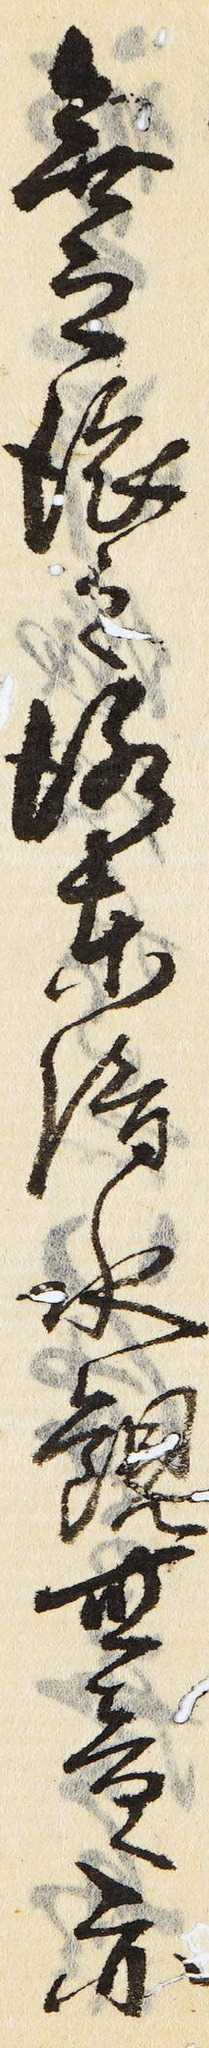無之依之洛東清水観世音へ亦
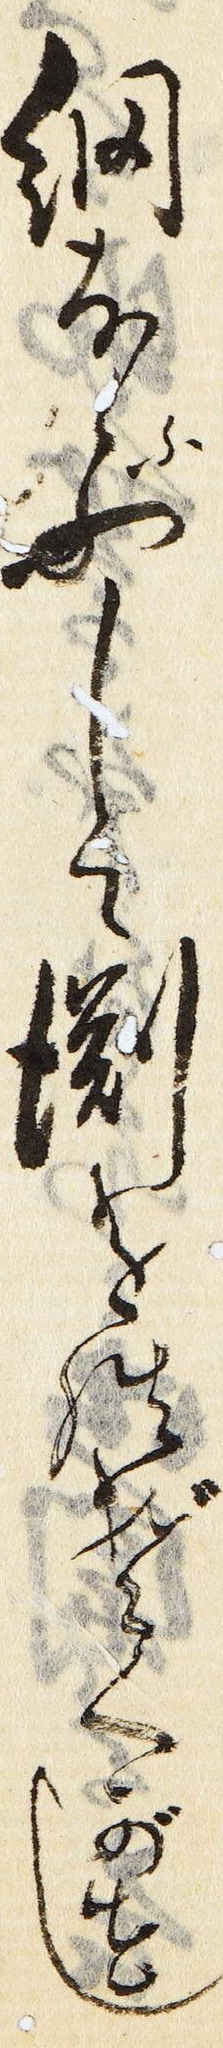網なふして淵をのぞくがことし
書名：阿波幸宝丸漂流記
